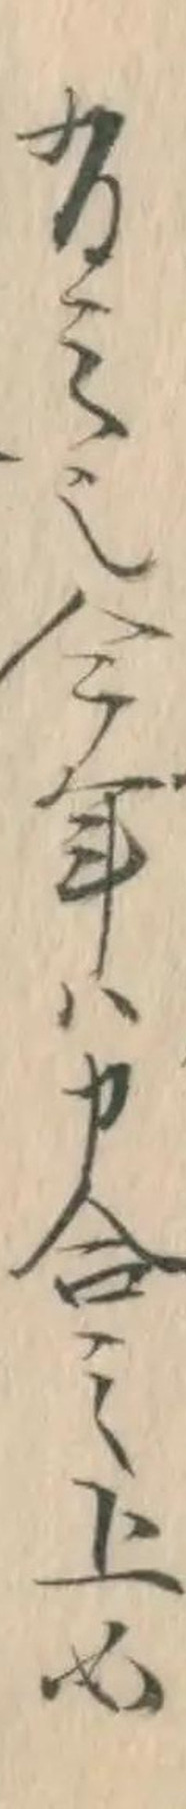有之也今年ハ申合之上如
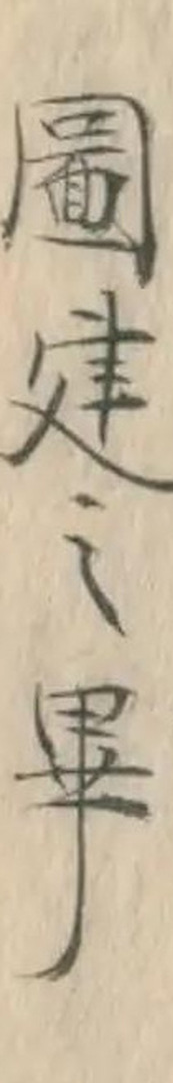図建之畢

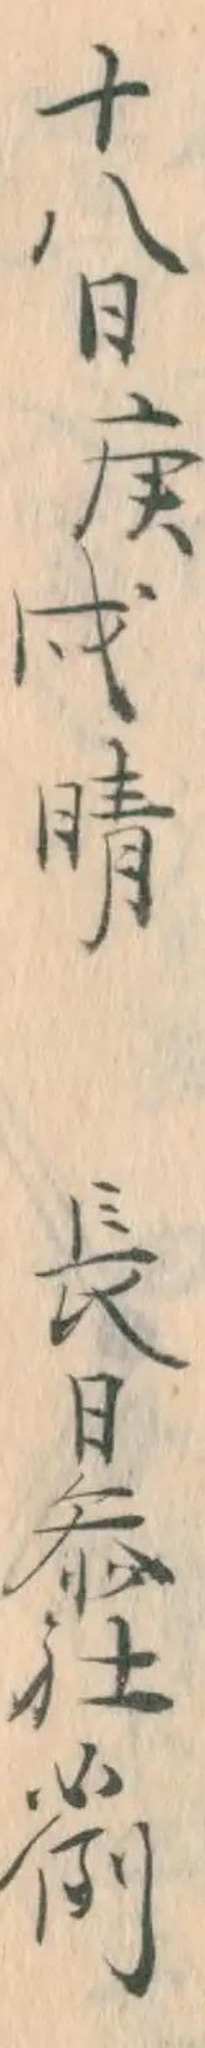十八日庚戌晴長日参社如例
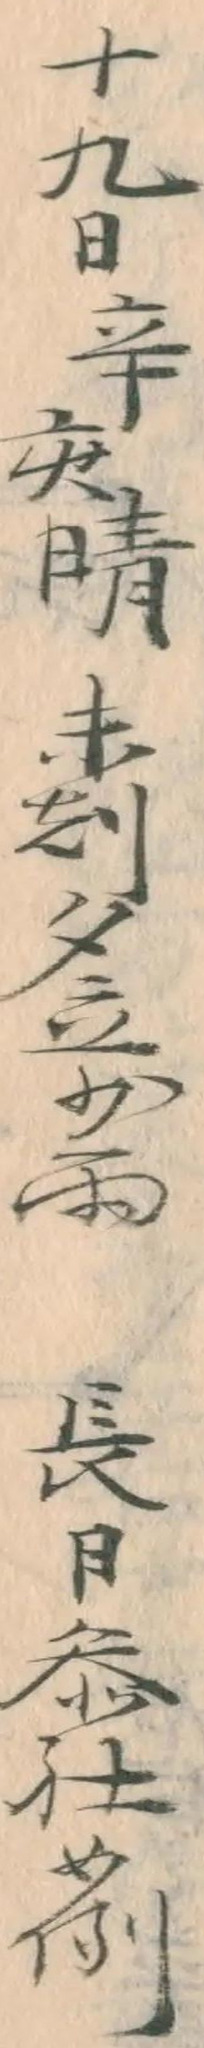十九日辛亥晴未刻夕立少雨長日参社如例
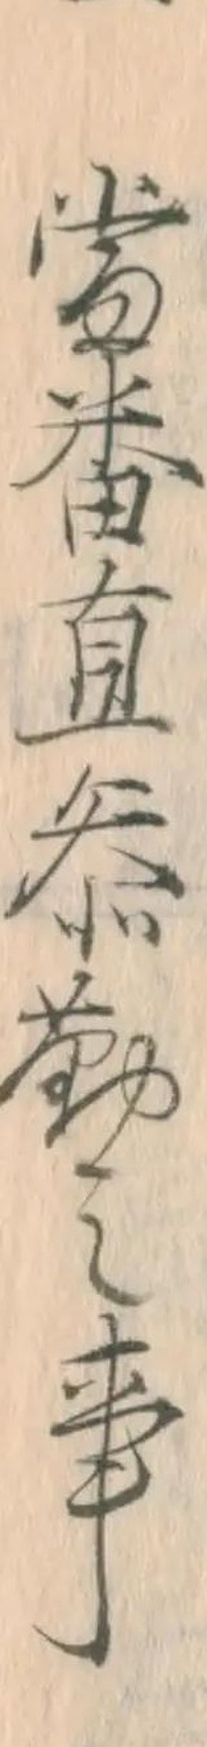一當番直参勤之事
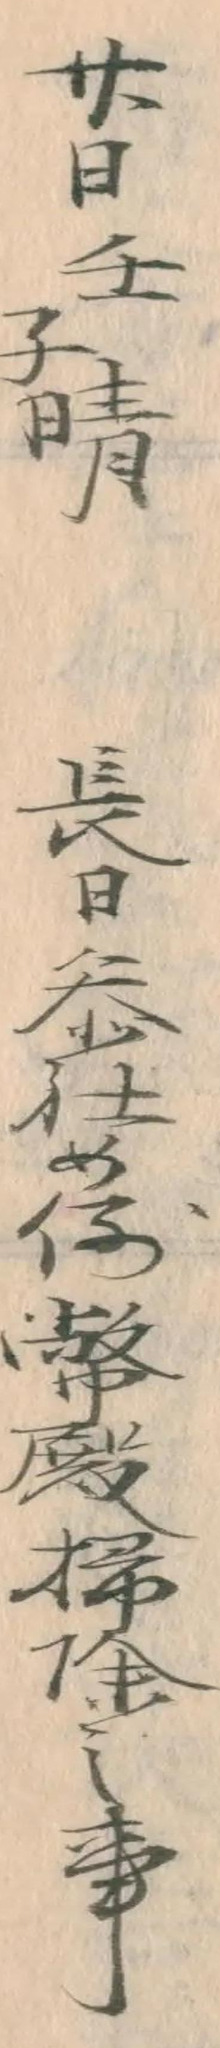廿日壬子晴長日参社如例幣殿掃除之事
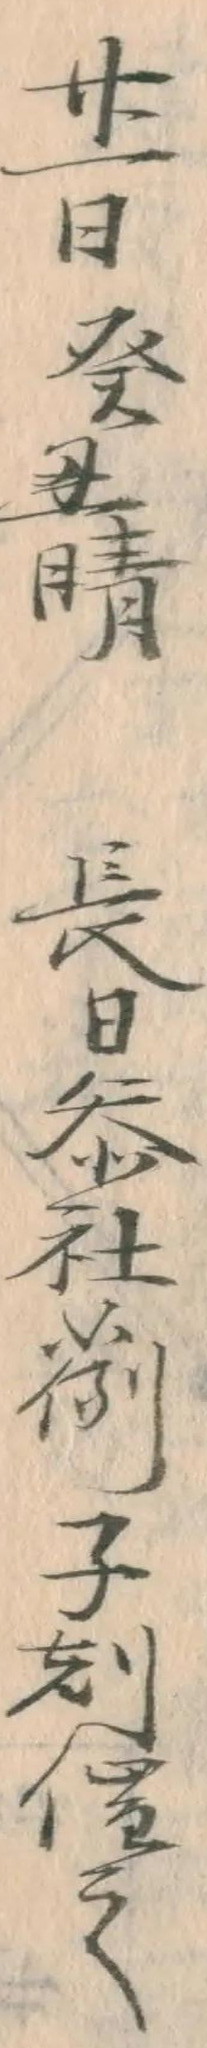廿一日癸丑晴長日参社如例子刻催也
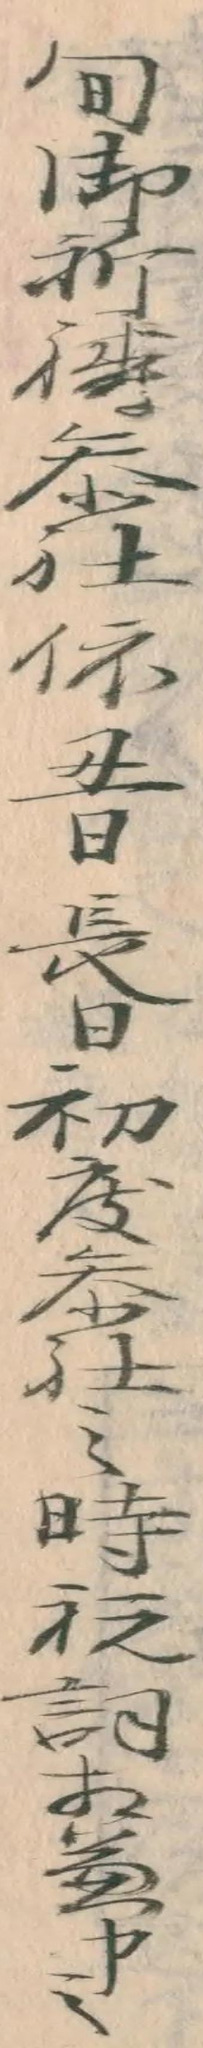一旬御祈祷参仕依丑日長日初度参社之時祝詞相兼申之
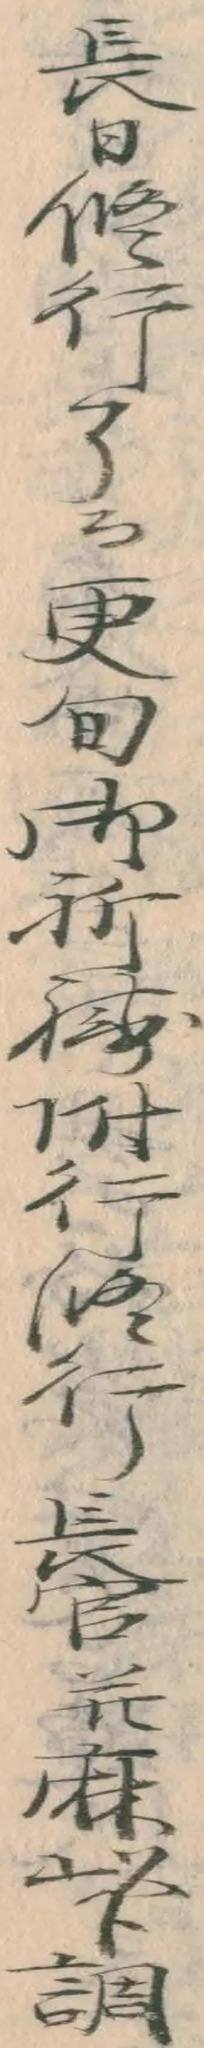長日修行了而更旬御祈祷附行修行長官并麻以下調
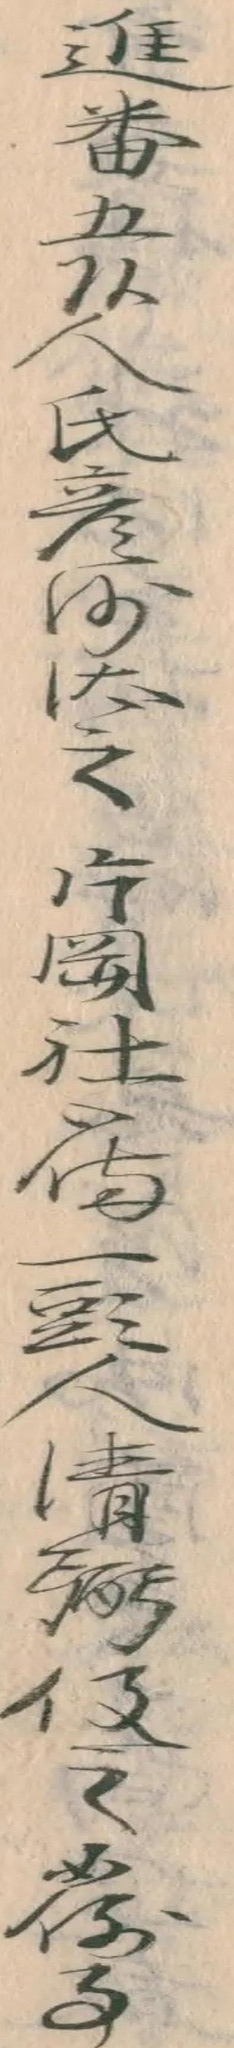進番五頭人氏彦沙汰之片岡社御備一頭人清弼役之如例事
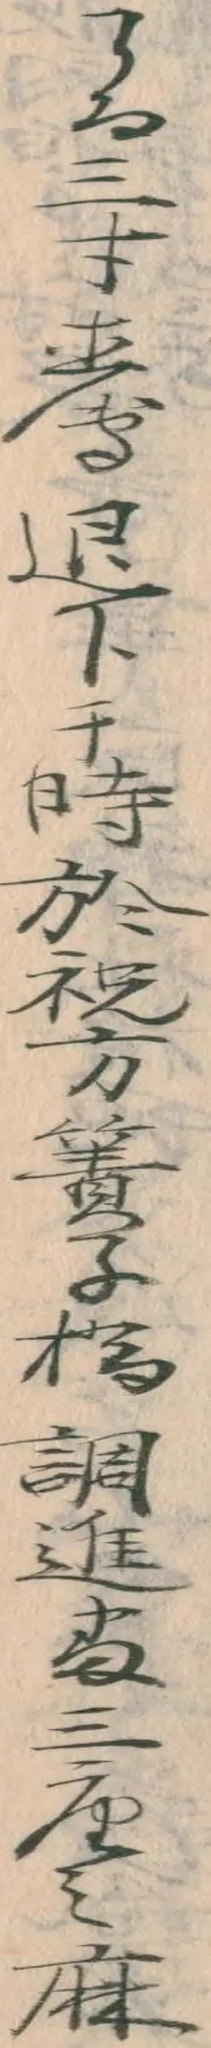了而三寸直會退下于時於祝方簀子橋調進番三座之麻
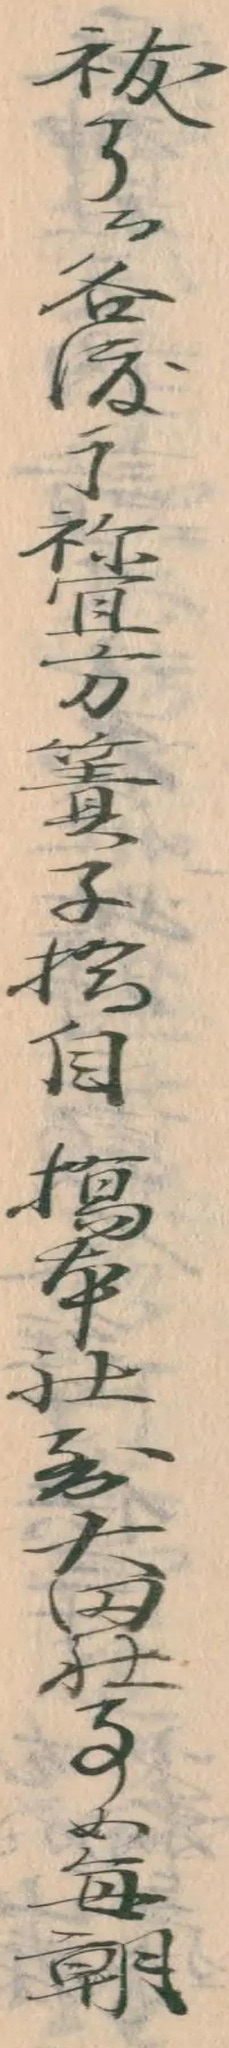祓了而各渡于祢宜方簀子橋自橋本社到大田社事如毎朝
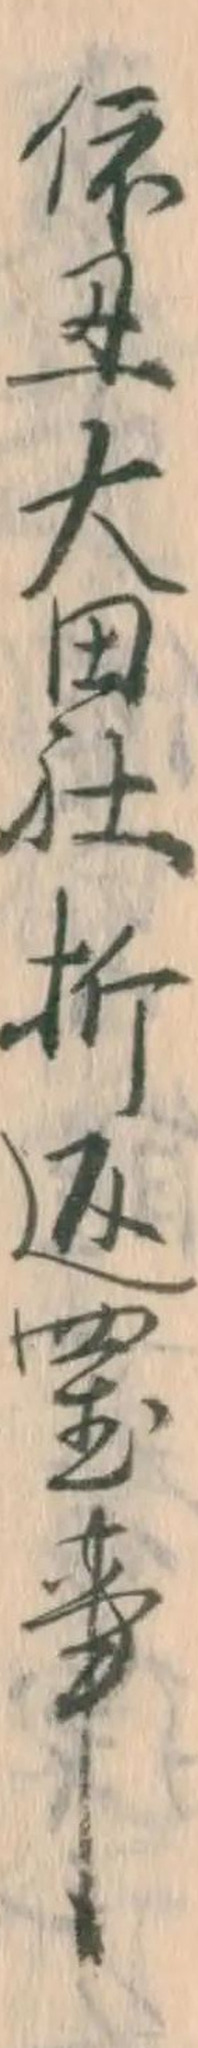依丑大田社折返置事
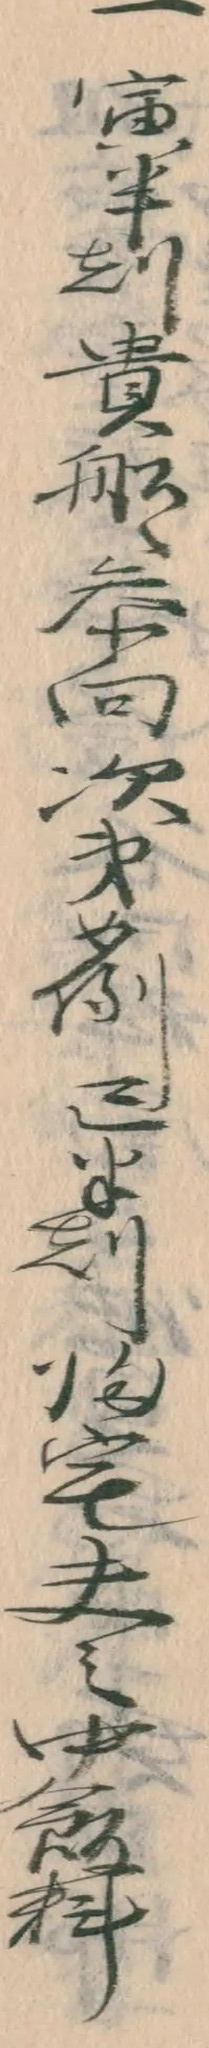一寅半刻貴舩へ参向次第如例巳半刻帰宅夫々中最科
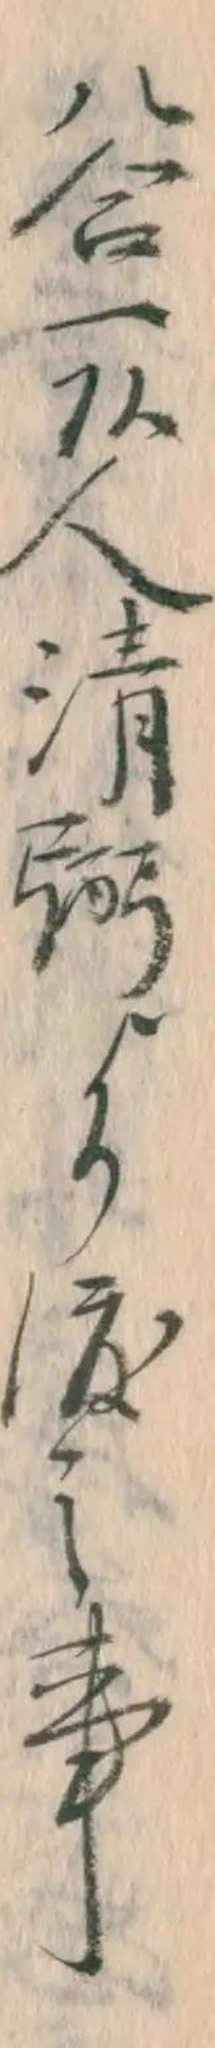八合一頭人清弼より渡之事
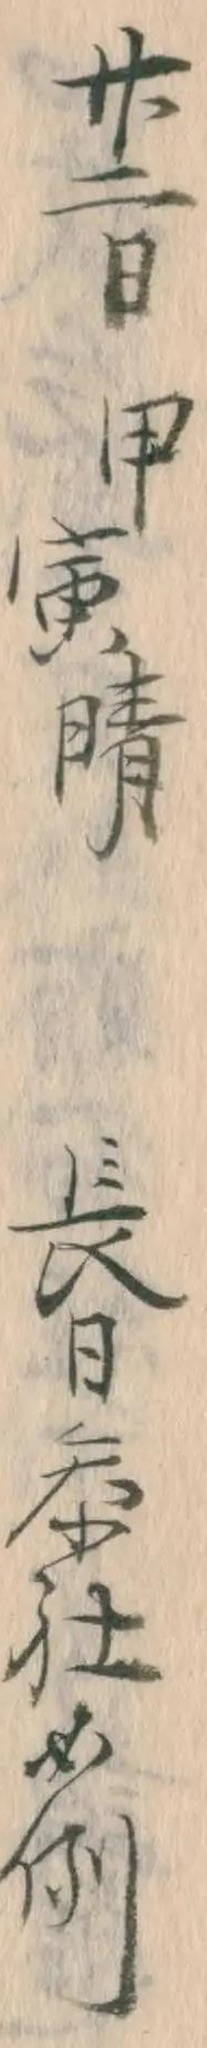廿二日甲寅晴長日参社如例
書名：賀茂社記録. 第73冊
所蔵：国立国会図書館 National Diet Library, JAPAN
